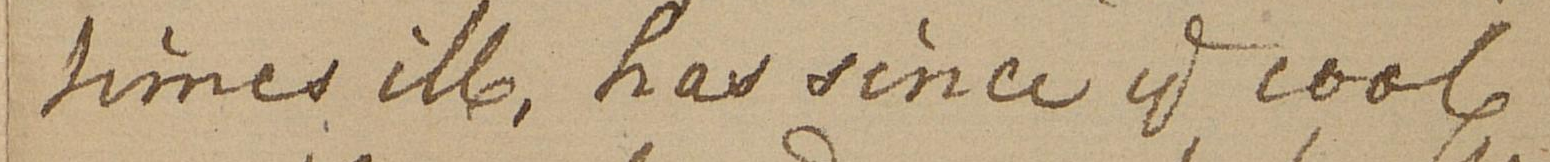times ill, has since y^e cool
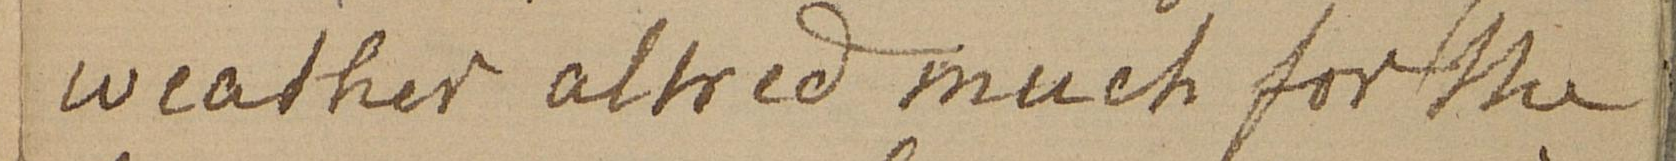weather altred much for the
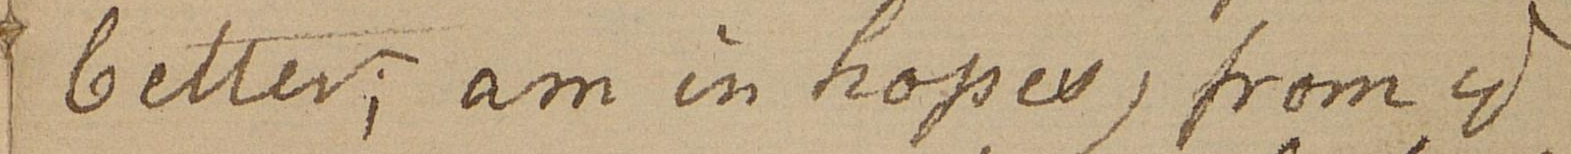better; am in hopes, from y^e
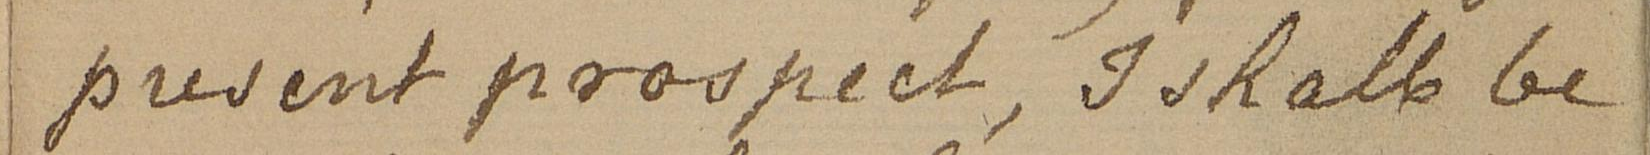present prospect, I shall be
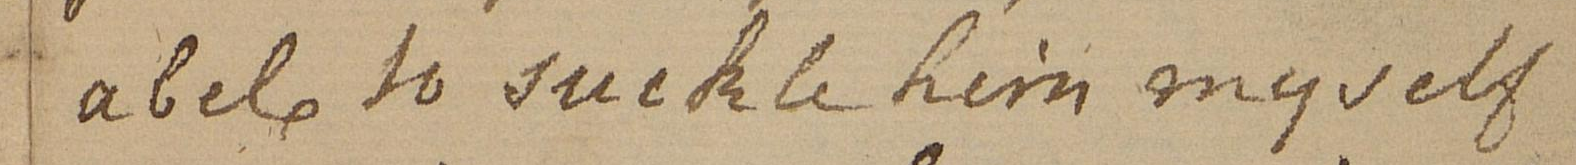abel to suckle him myself
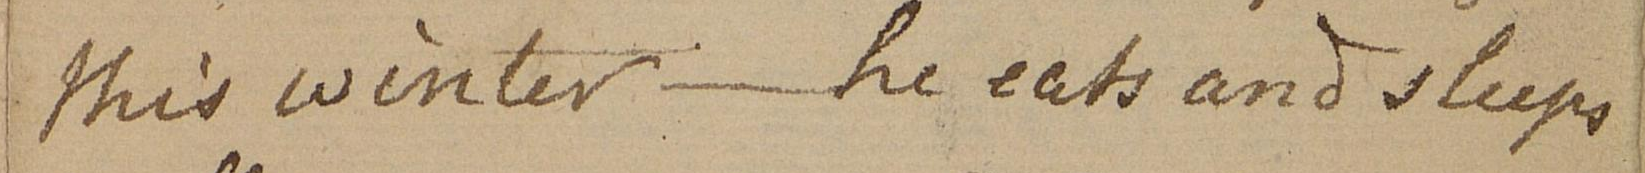this winter- he eats and sleeps
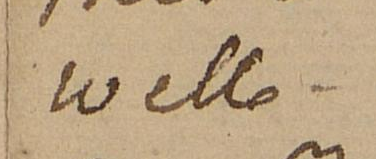well-
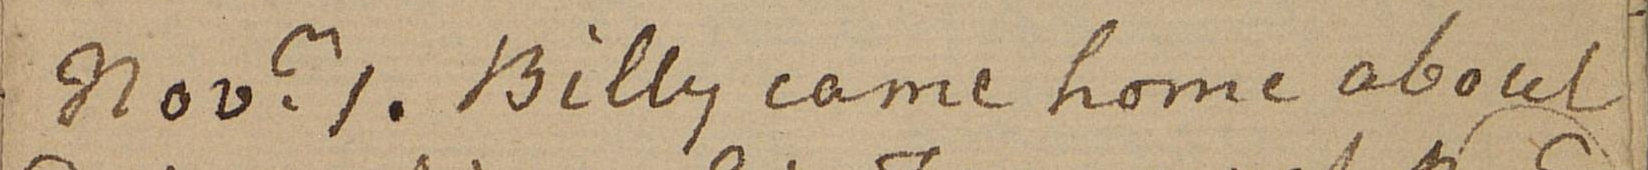Nov^r. 1. Billy came home about
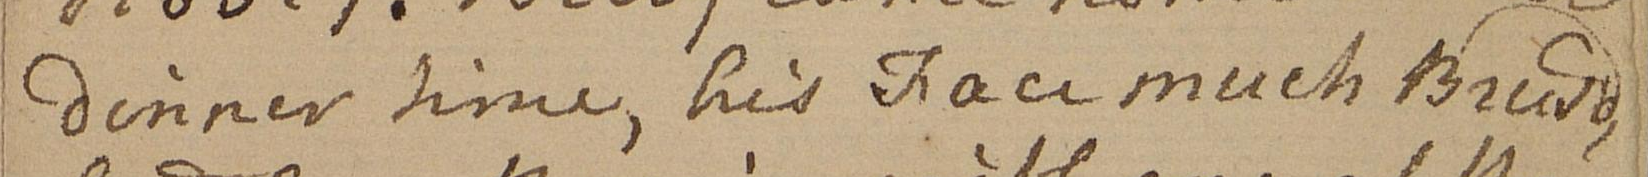dinner time, his Face much Brus'd,
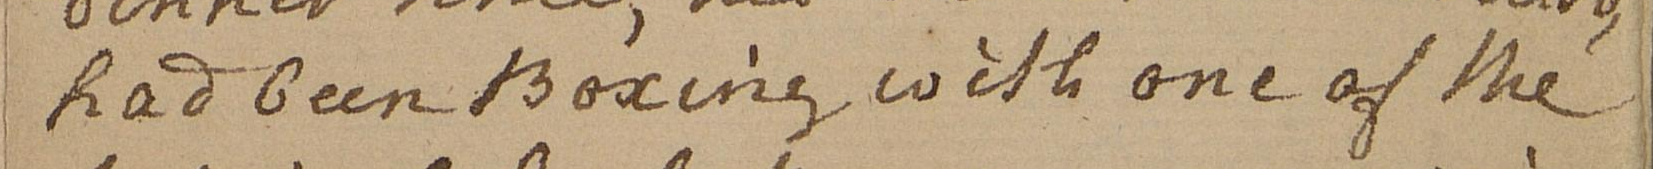had been Boxing with one of the
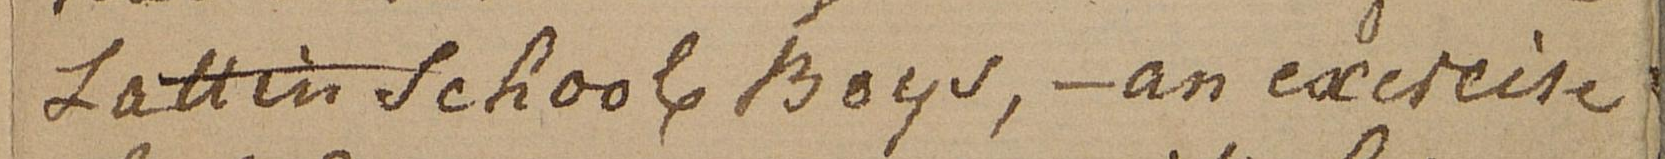Lattin School Boys,- an exercise
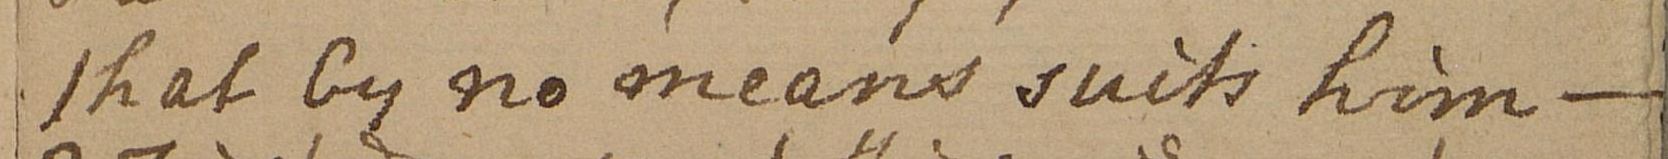that by no means suits him-
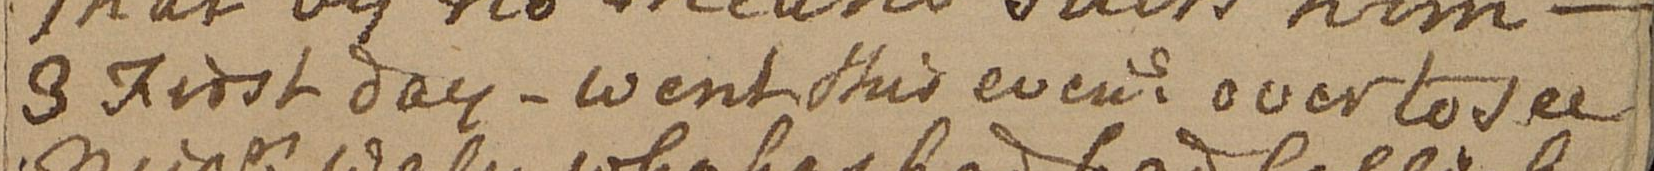3 First day- went this even^g. over to see
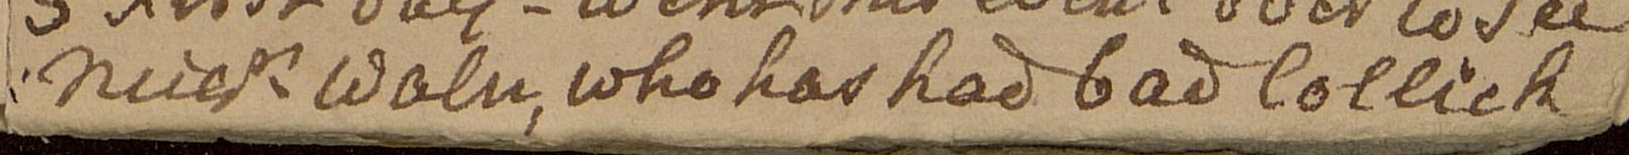Neig^r. Waln, who has had bad Collick
